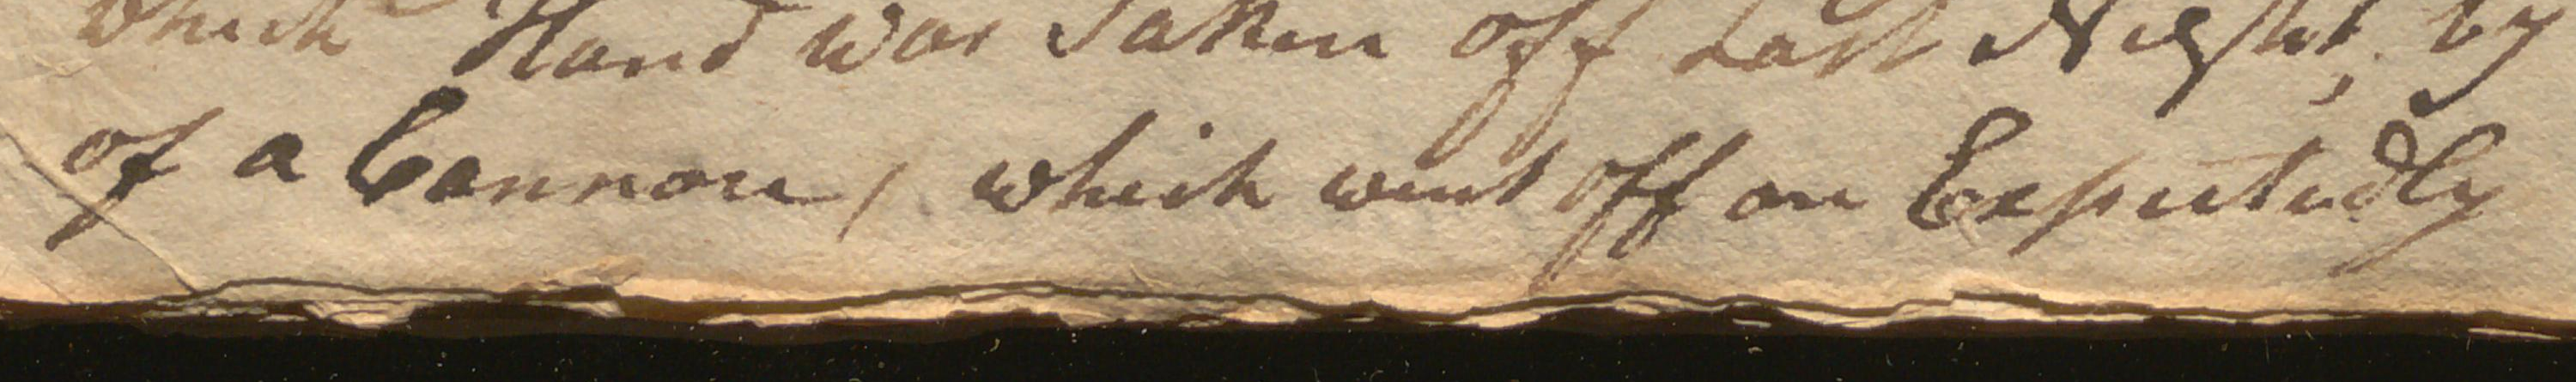of a Cannon, which went of on Expectedly
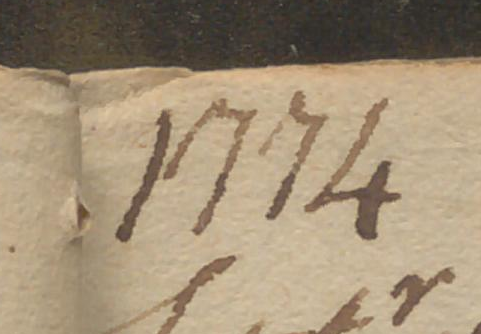1774
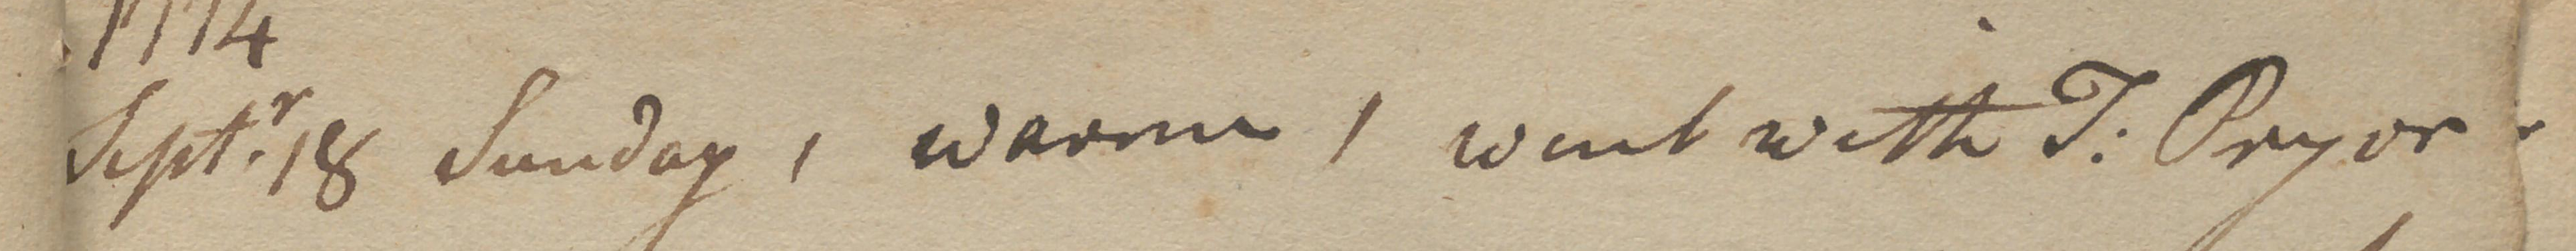Sept^r. 18 Sunday, warm / went with T. Pryor
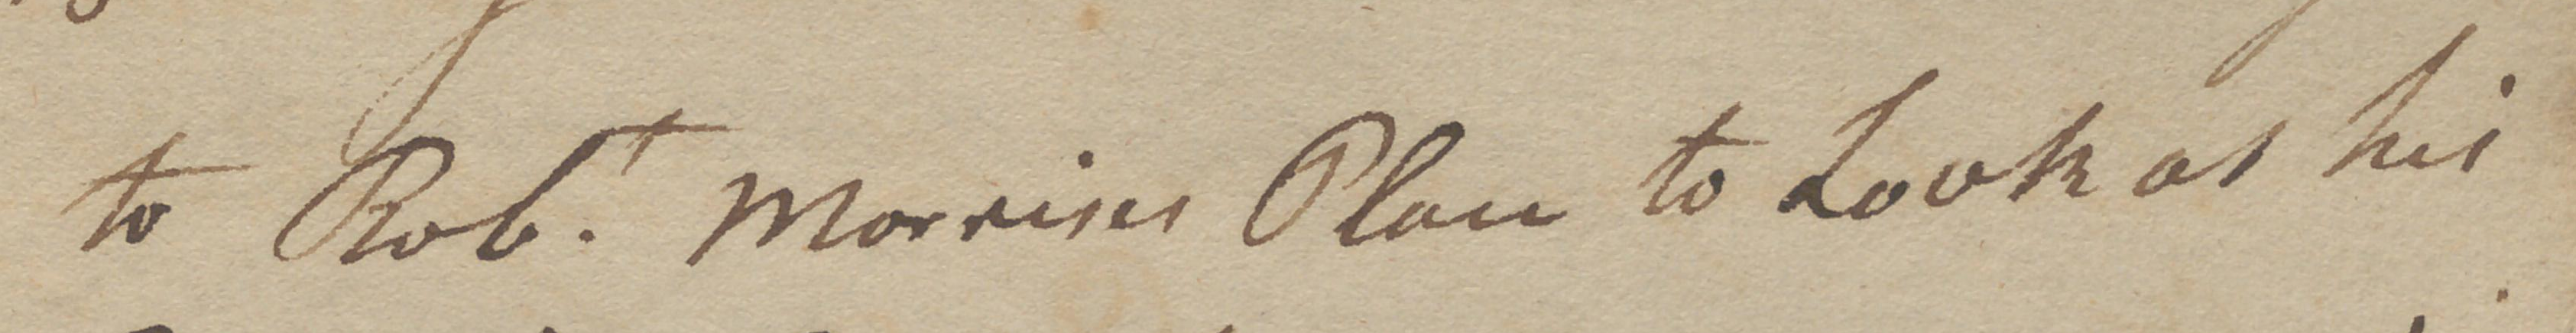to Rob^t. Morrises Place to Look at his
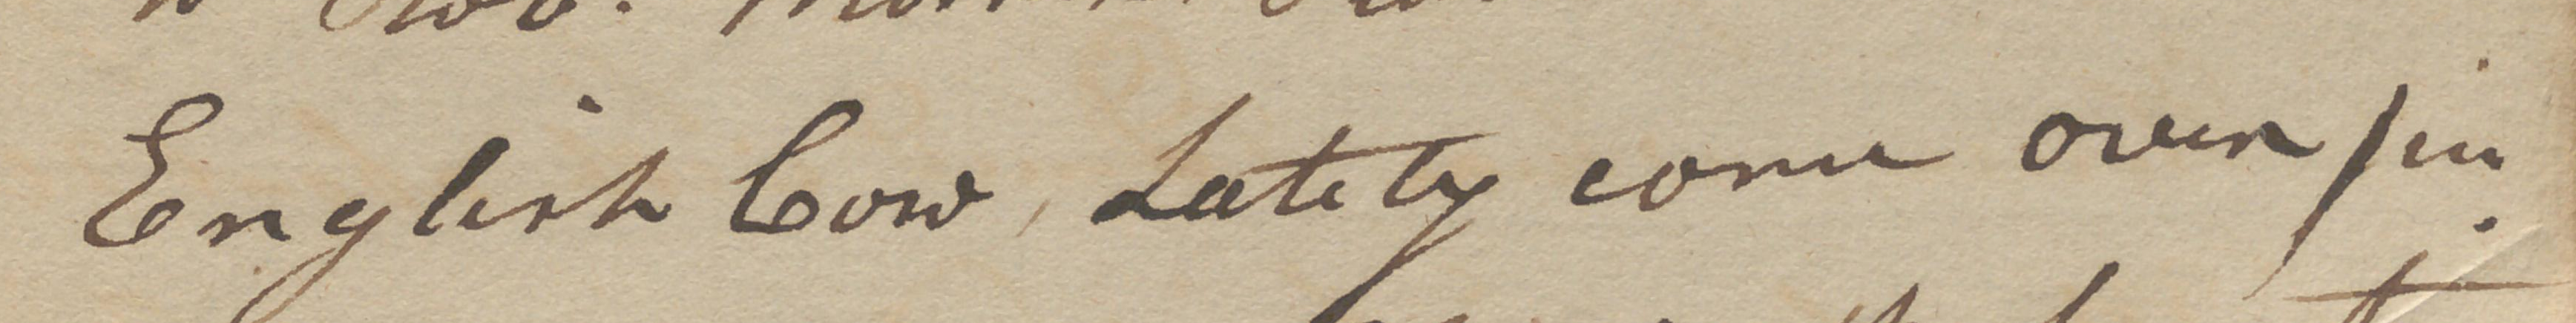English Cow, Latety come over / in
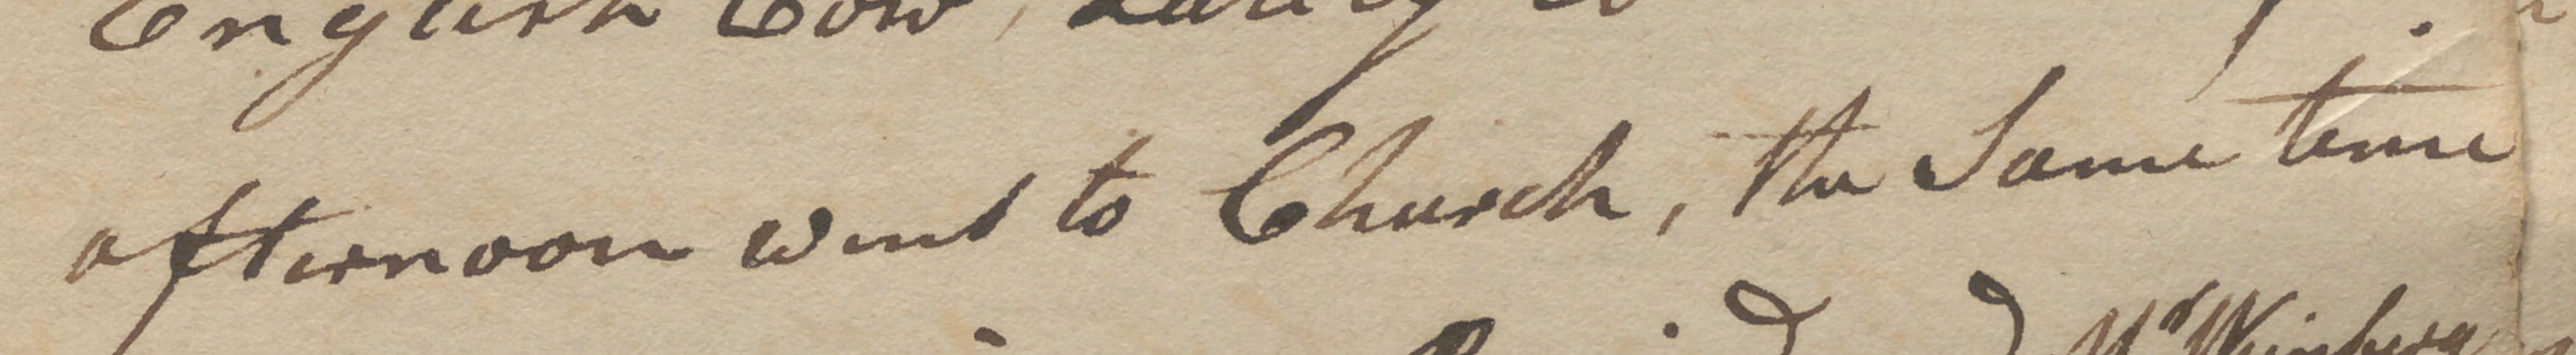afternoon went to Church, the Same time
